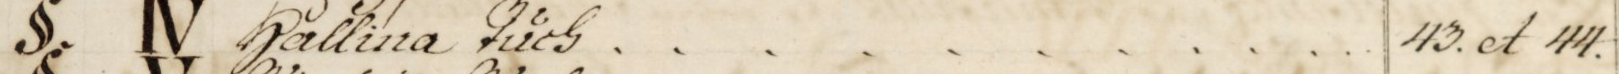§. IV Hallina Tuch. 43. et 44.
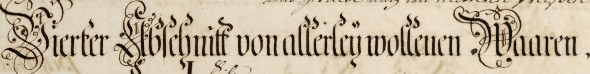Vierter Abschnitt von allerley wollenen Waaren.
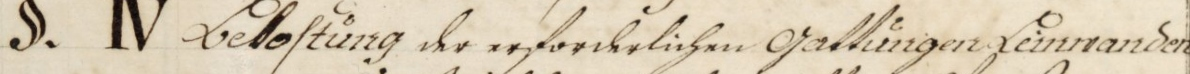§. IV Bekostung der erforderlichen Gattungen Leinwanden
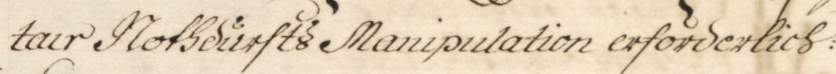tair Nothdurfts Manipulation erforderlich.
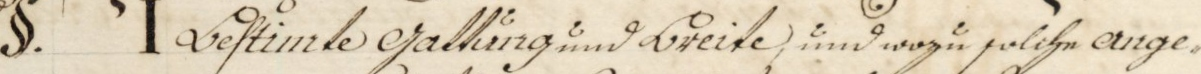§. I Bestimte Gattung und Breite, und wozu solche ange-
